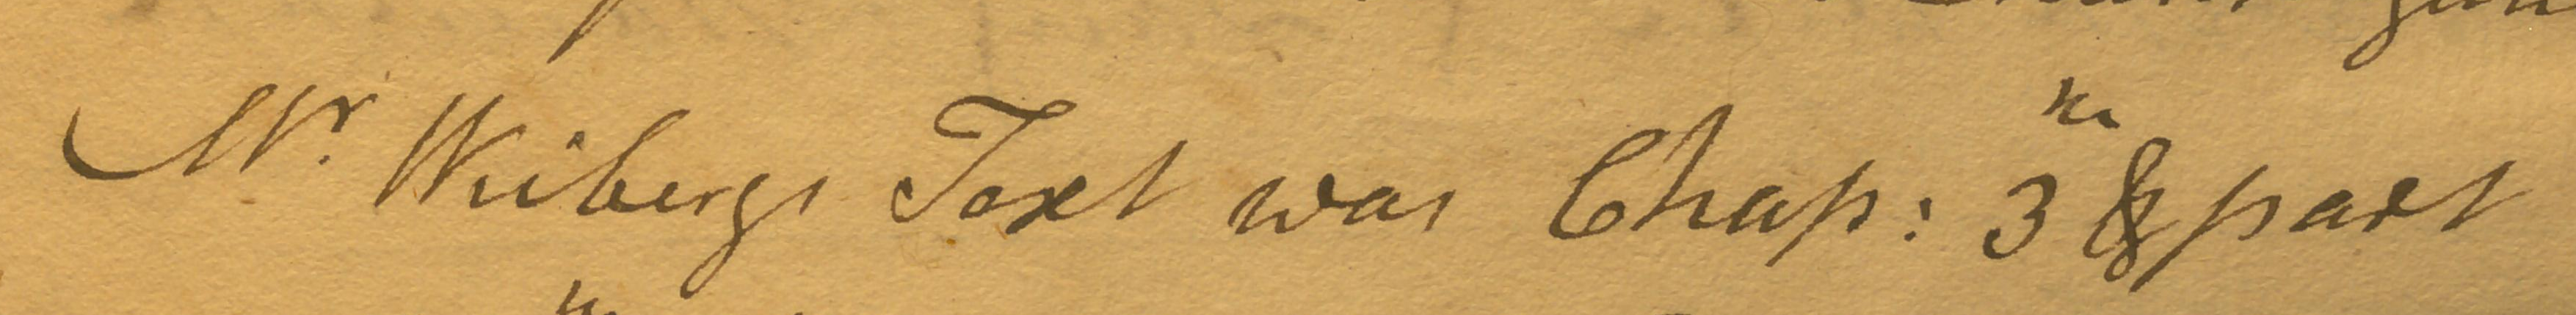M^r. Weibergs Text was Chap: 3^th & part
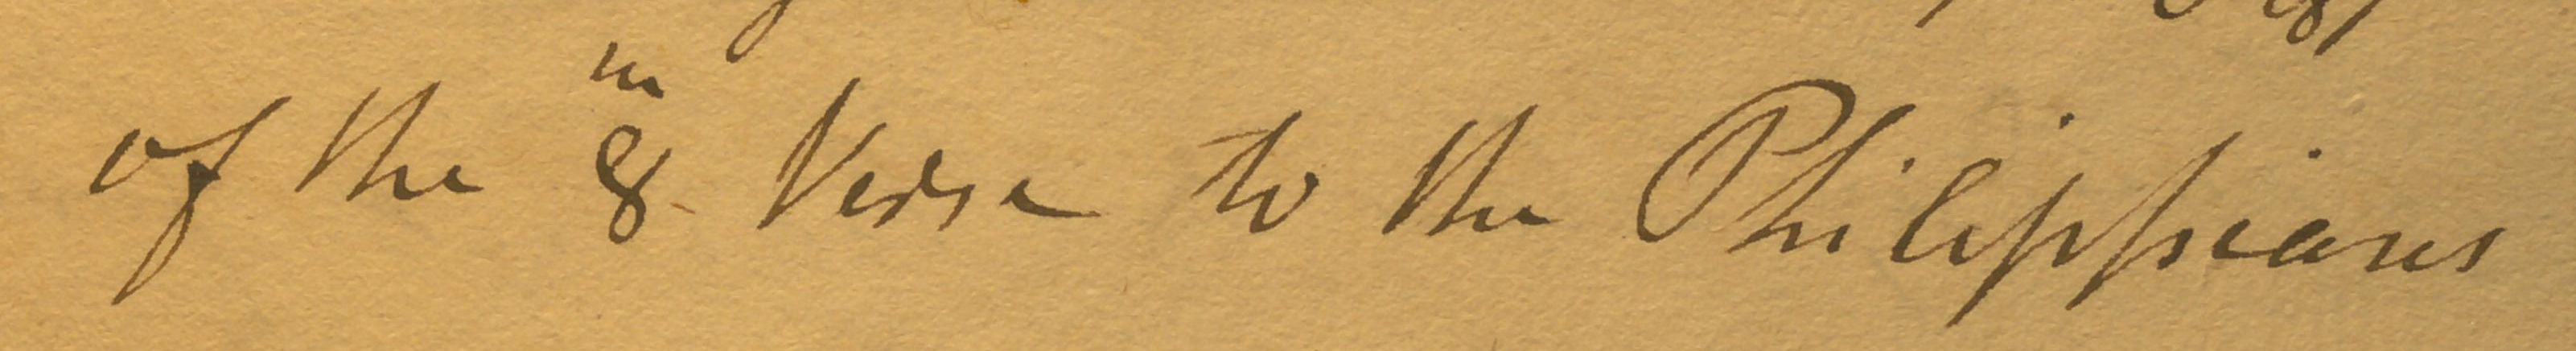of the 8^th Verse to the Philippeans
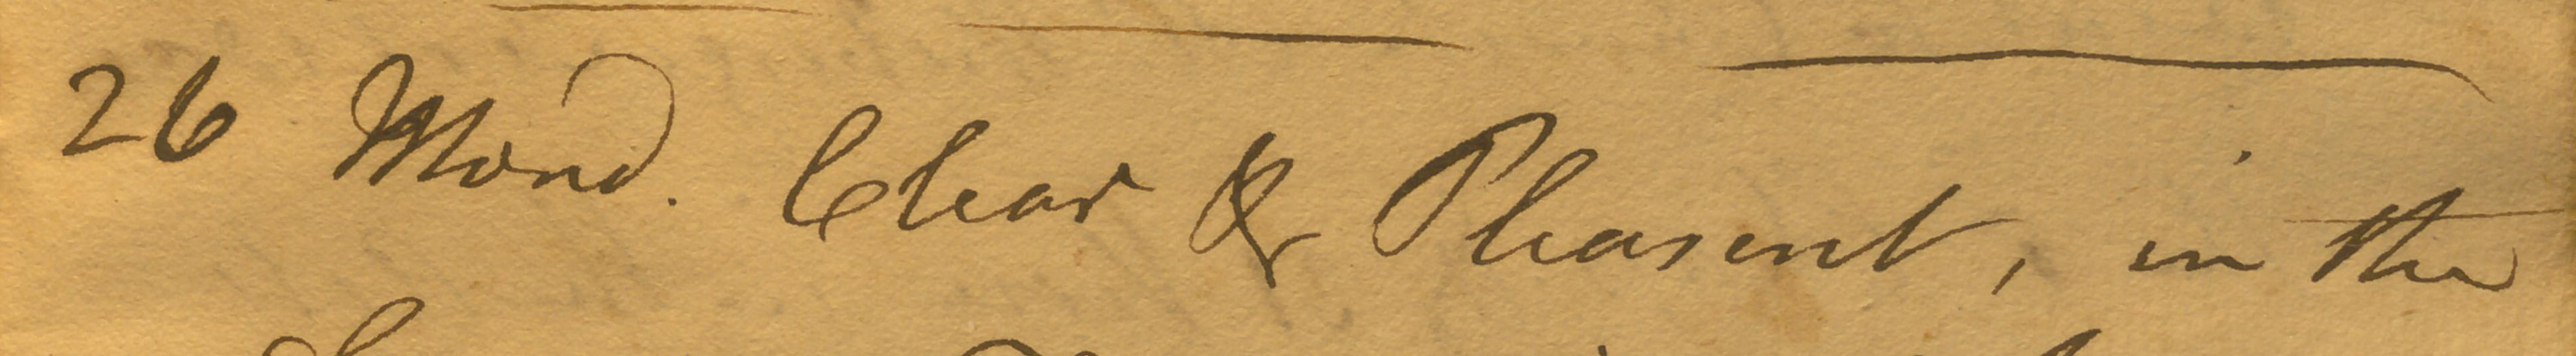26 Mond. Clear & Pleasent, in the
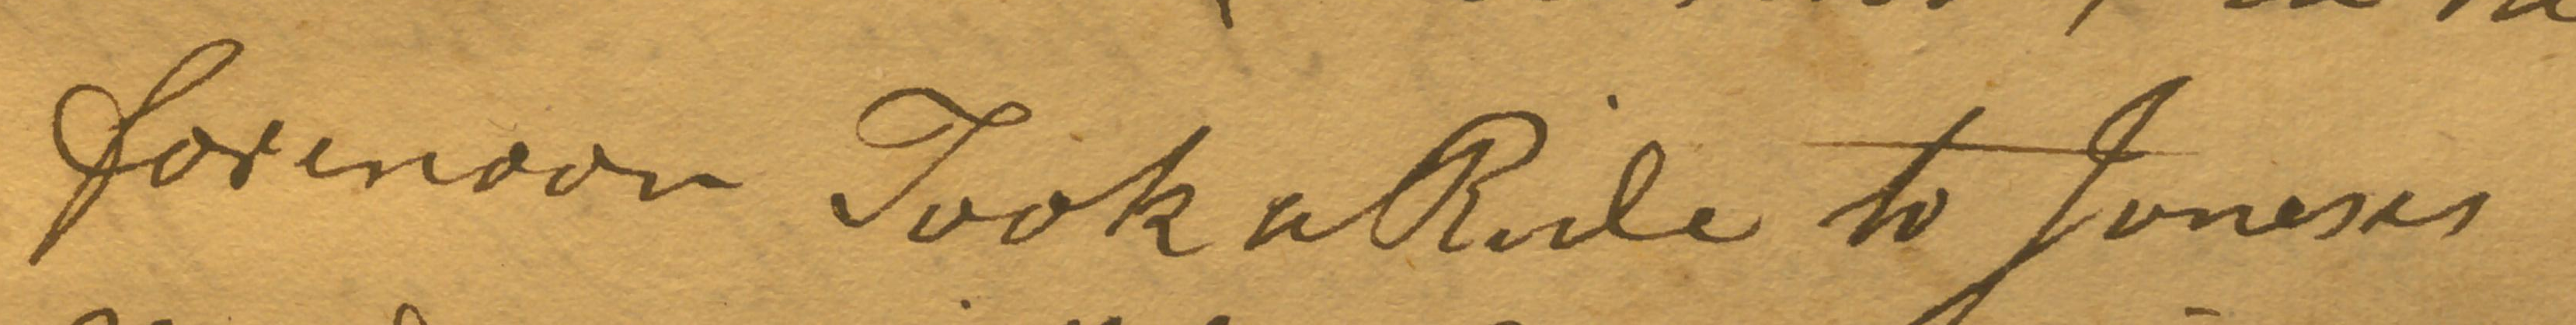forenoon Took a Ride to Joneses
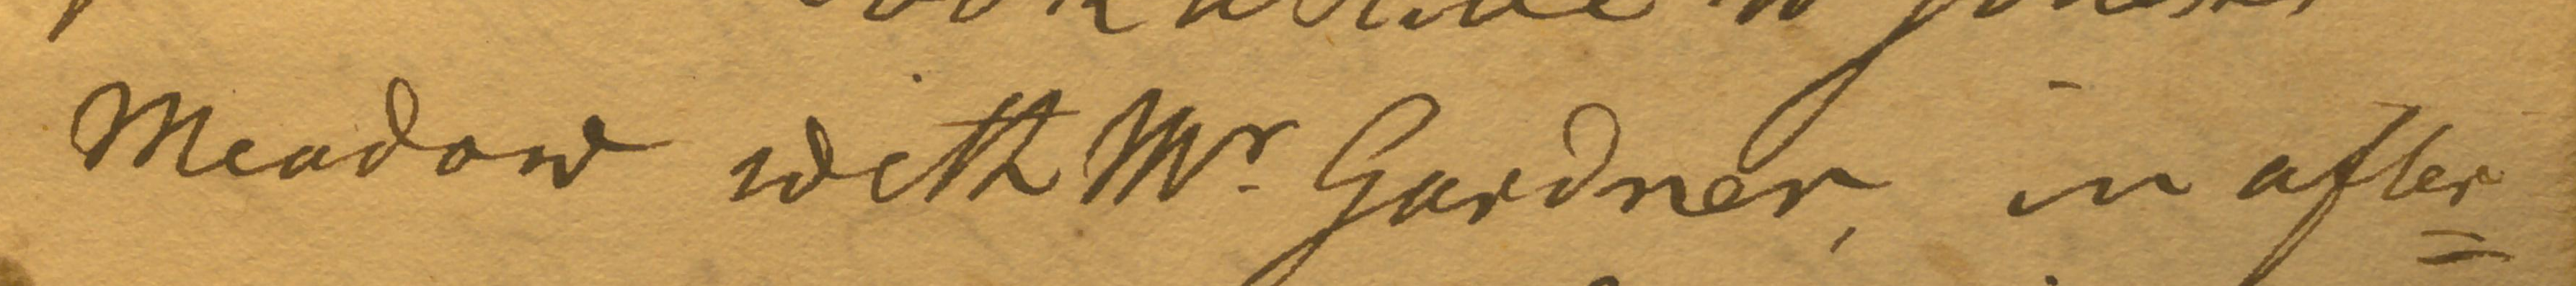Meadow with M^r. Gardner in after
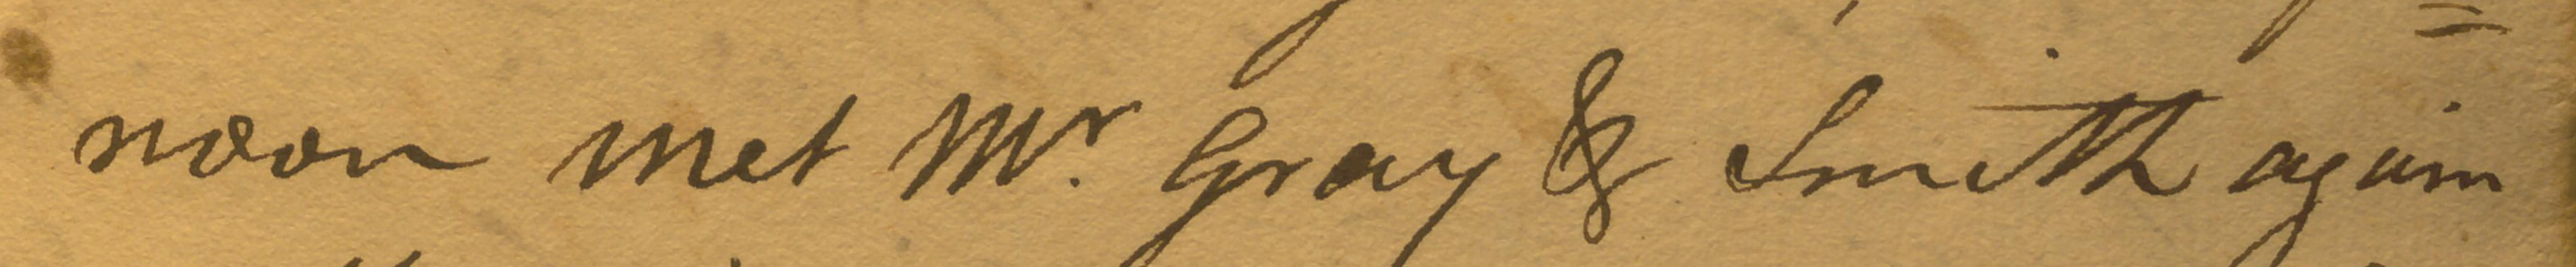noon met M^r. Gray & Smith again
